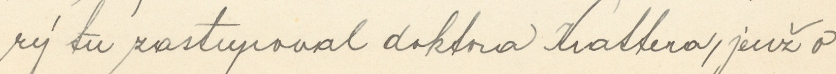rý tu zastupoval doktora Krattera, jenž o
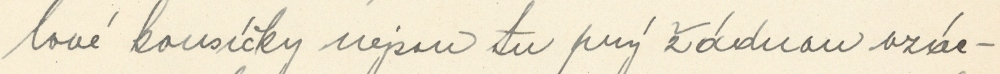lové kousíčky nejsou tu prý žádnou vzác-
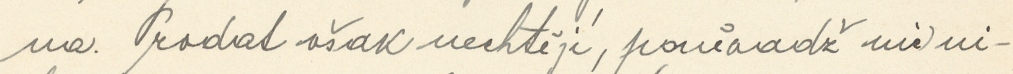na. Prodat však nechtějí, poněvadž nic ni-
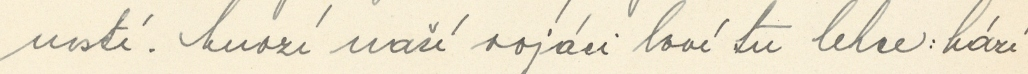ností. Mnozí naší vojáci loví tu lehce: hází
